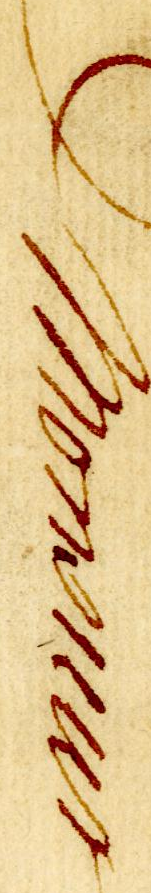Monsieur
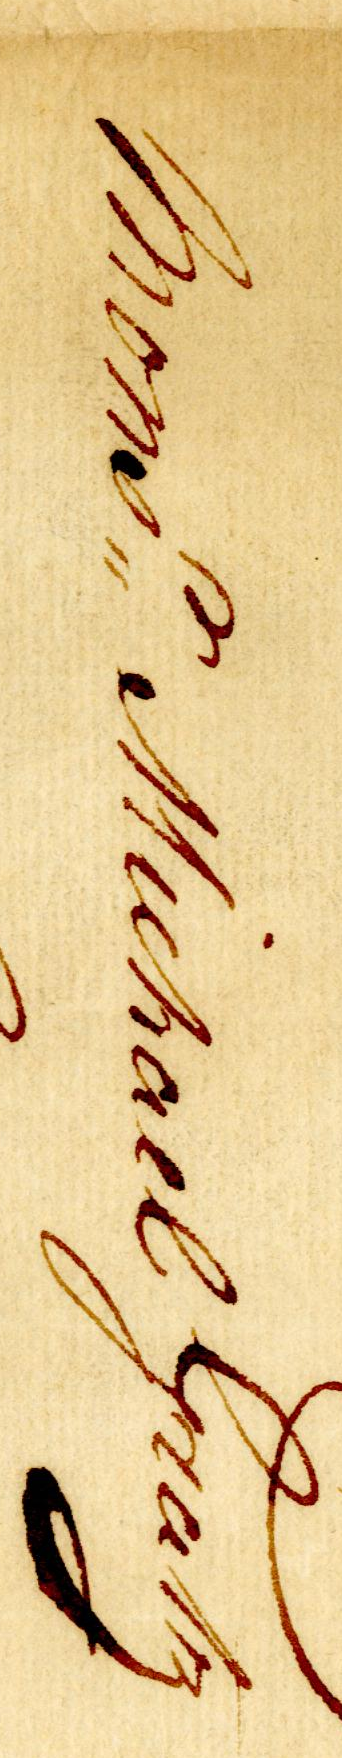Mons^r. Michael Gratz
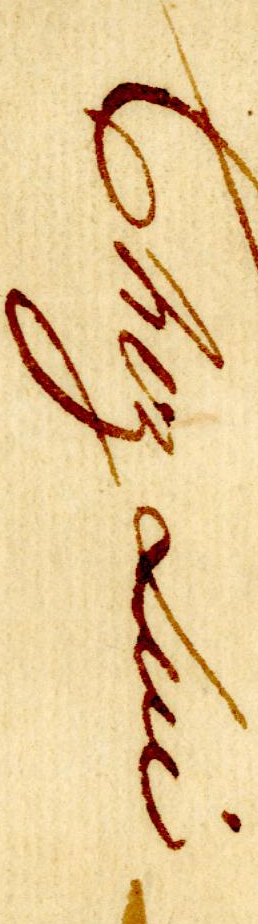Chez Lui
